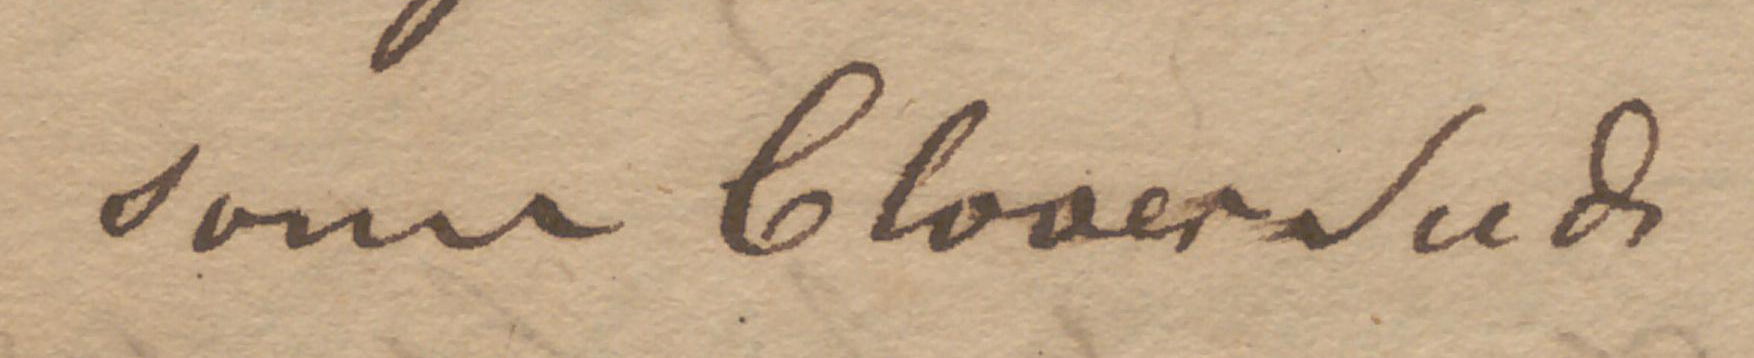some Clover seed
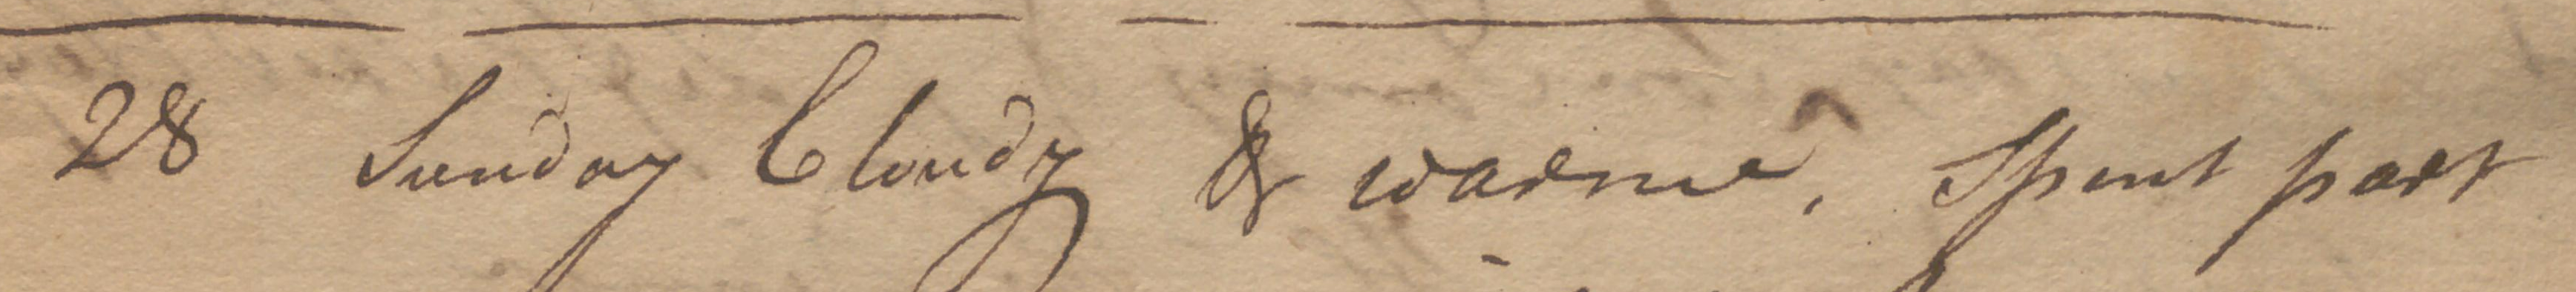28 Sunday Cloudy & warme. spent part
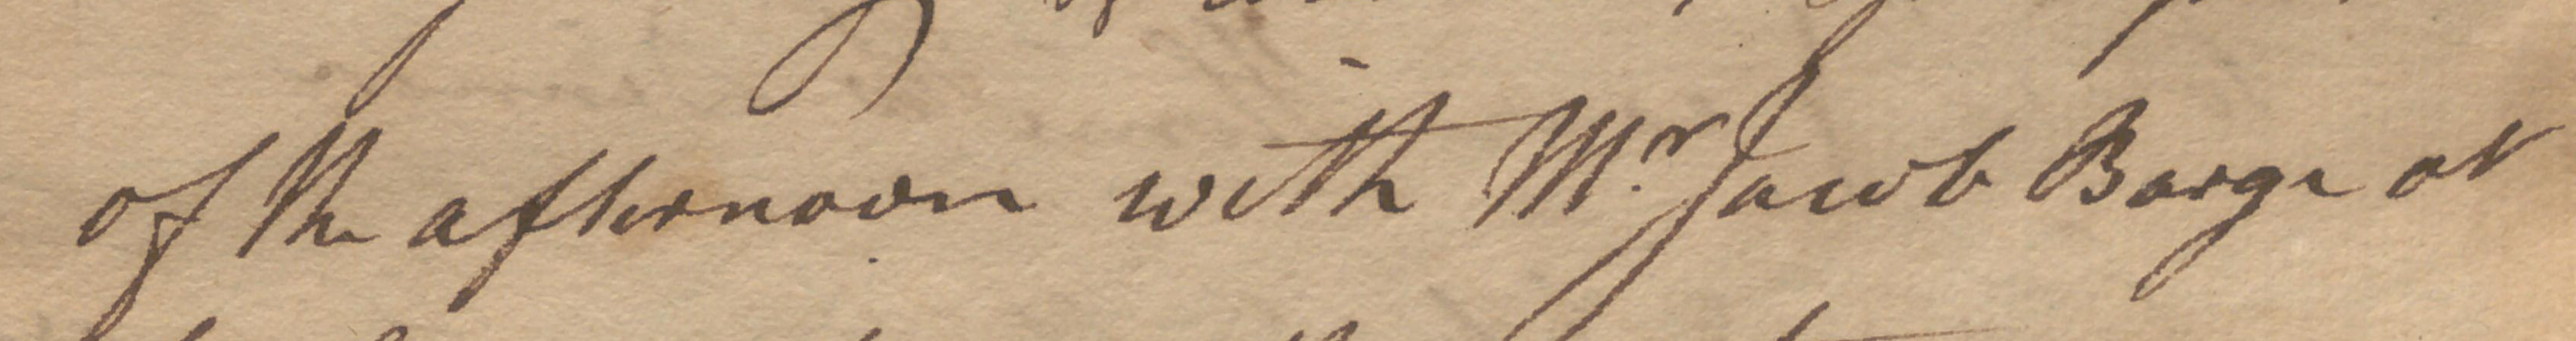of the afternoon with M^r. Jacob Barge at
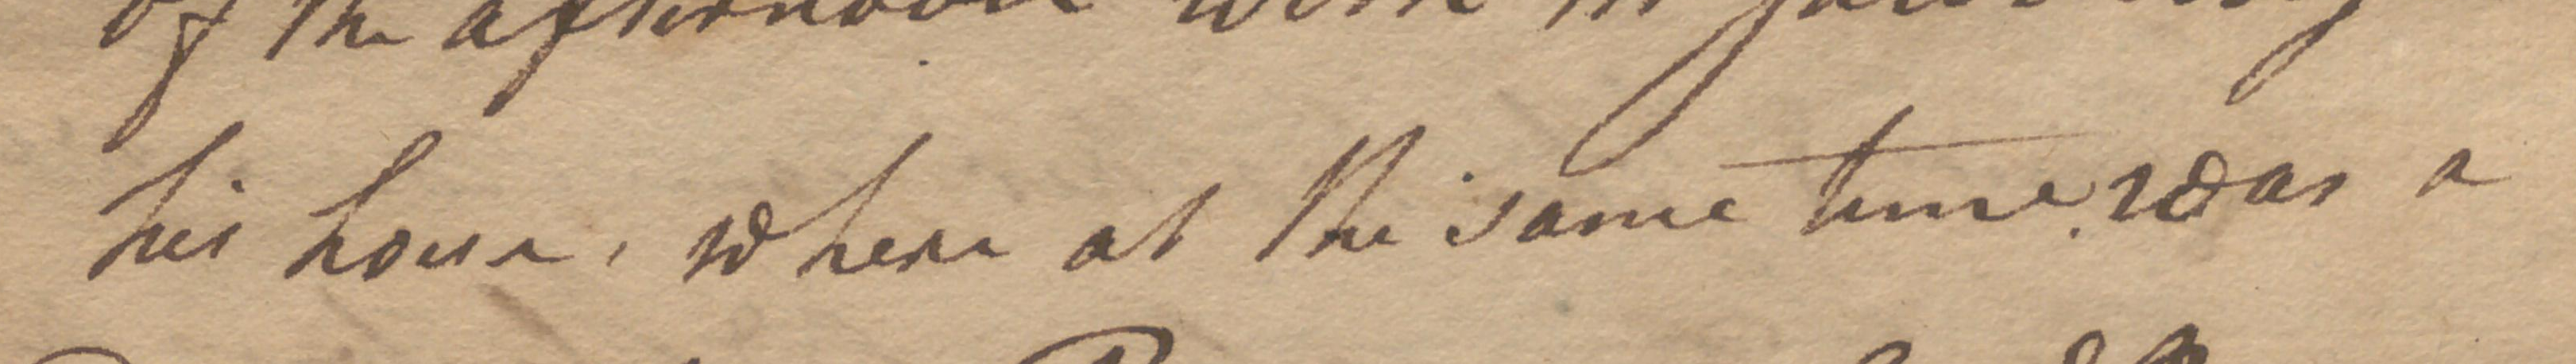his house, where at the same time was a
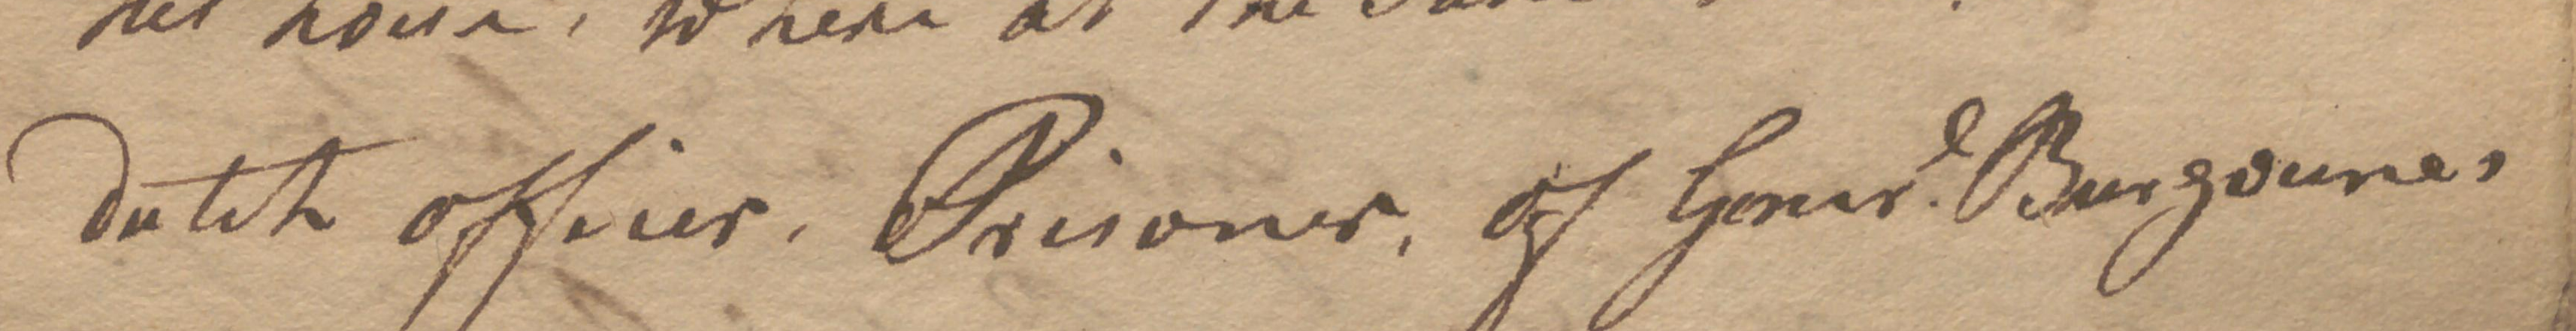dutch officer, Prisoner, of Gener^l. Burgounes
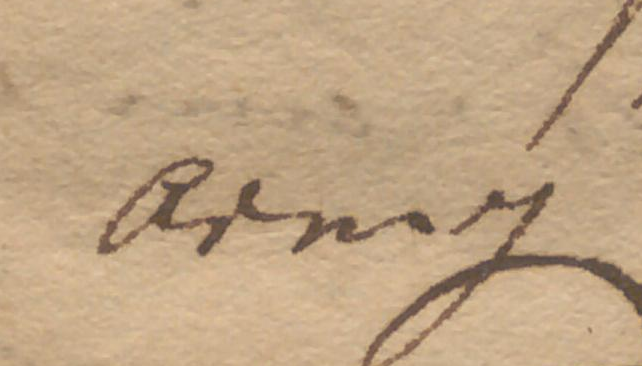army
